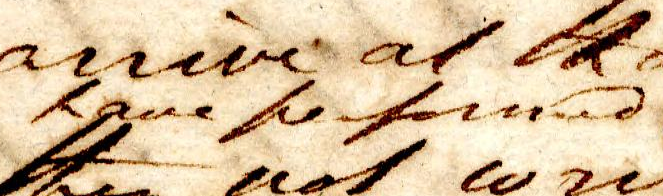have performed
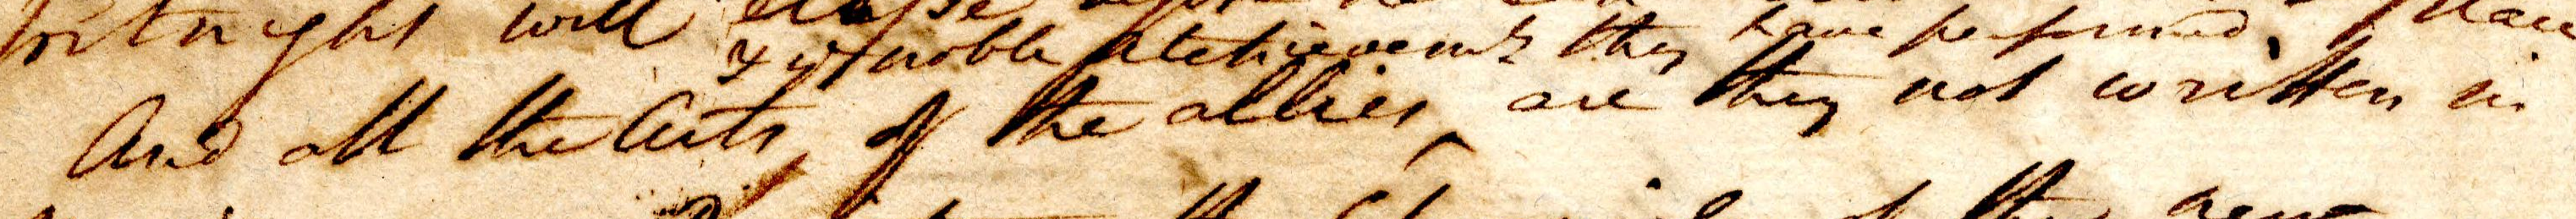And all the Acts of the allies ^ are they not written in
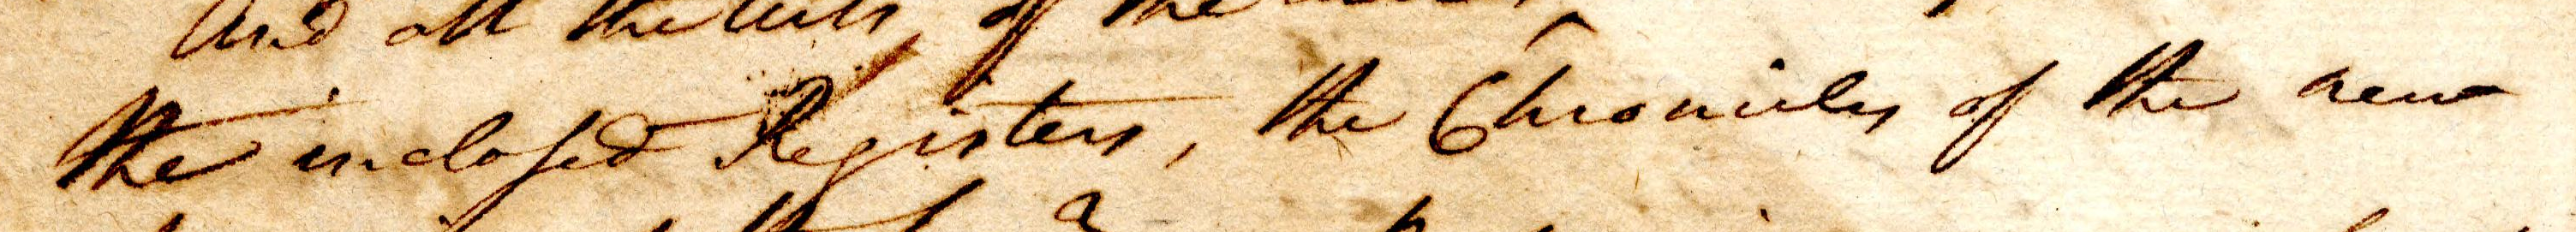the inclosed Registers, the Chronicles of the new
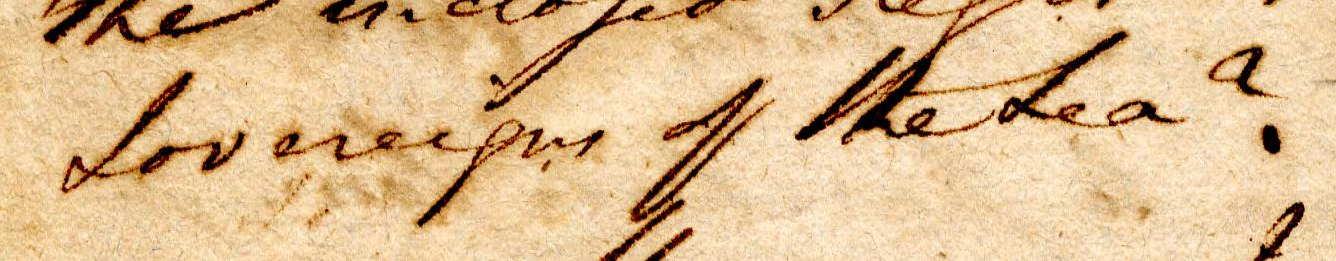Sovereigns of the Sea?
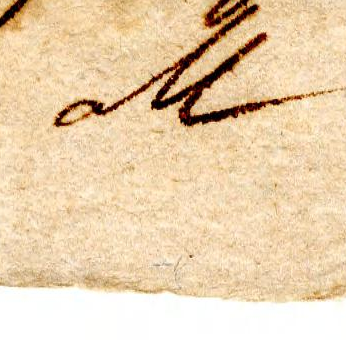M
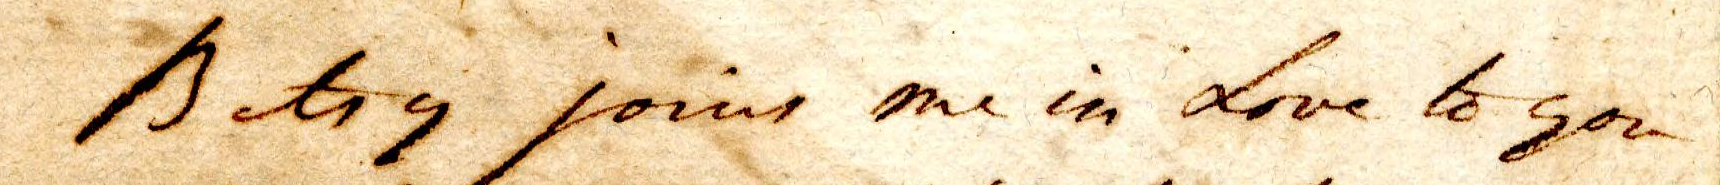Betsy joins me in Love to you
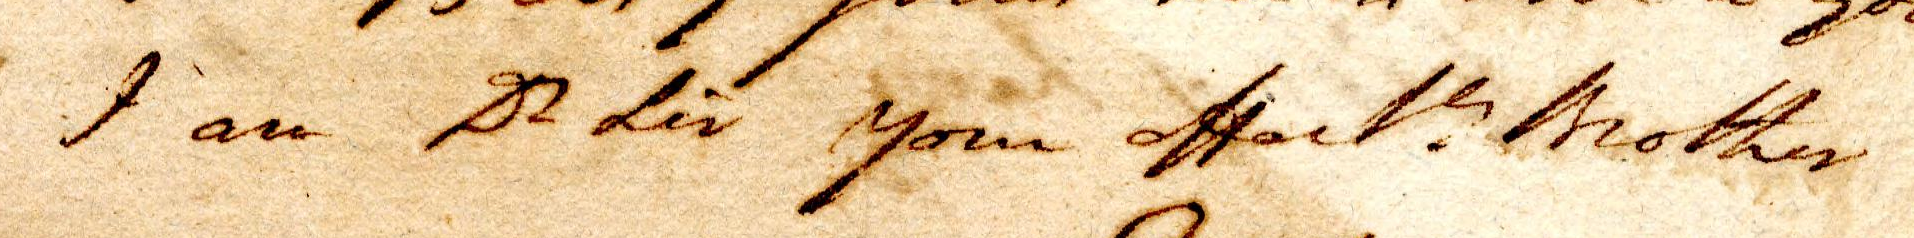I am D^r Sir your affect^e. Brother
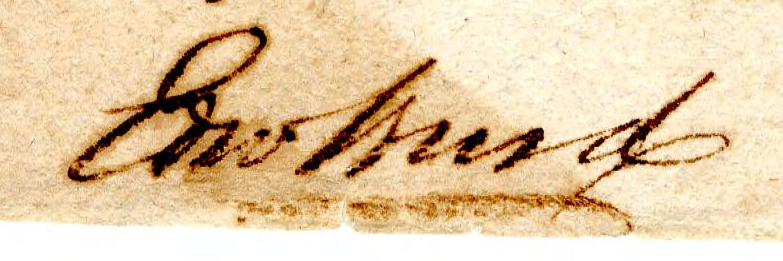Edw Burd
